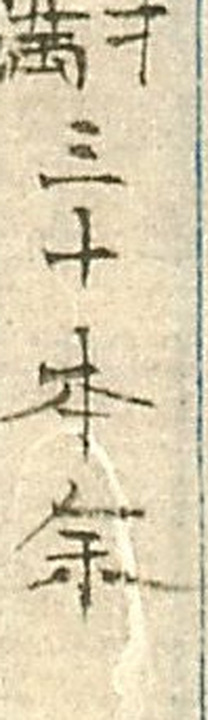苗三十本余
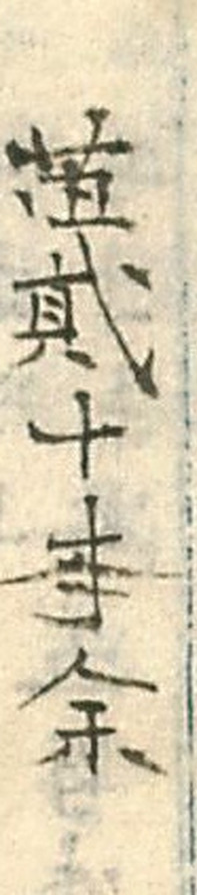苗弐十本余

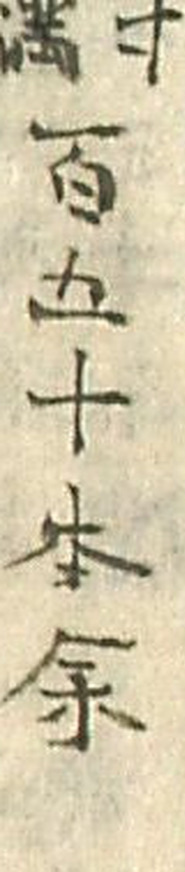苗七十本余
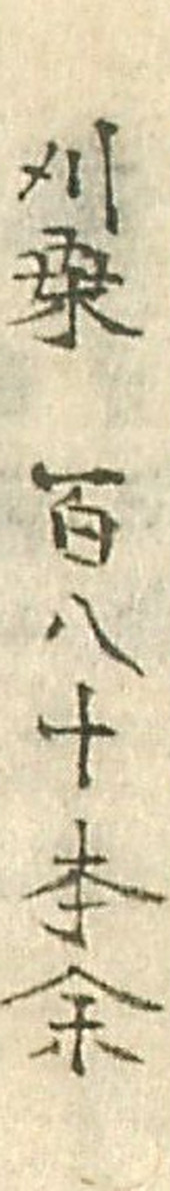刈桑百八十本余
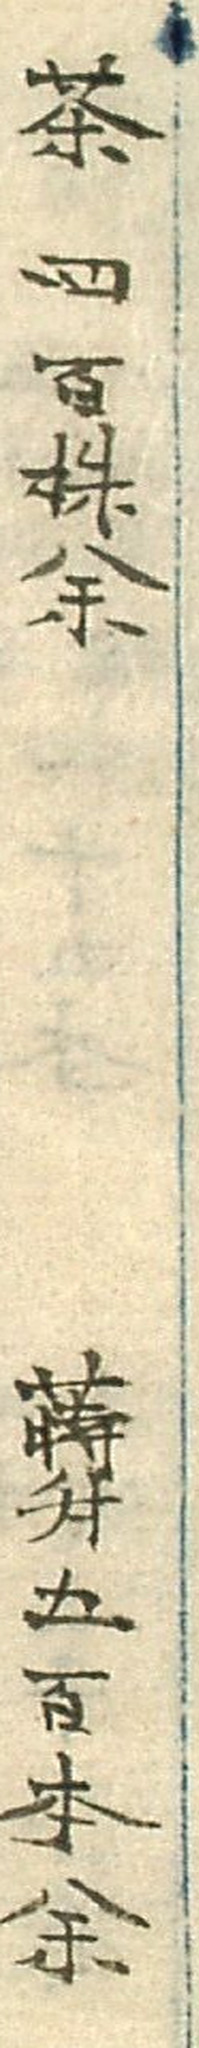茶四百株余蒔付五百本余
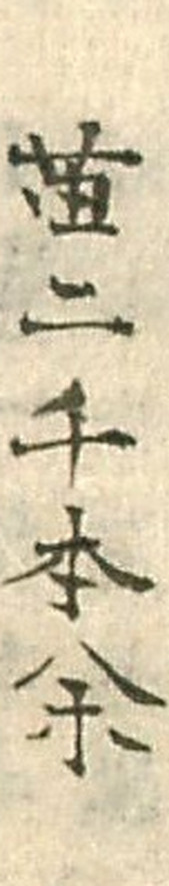苗二千本余
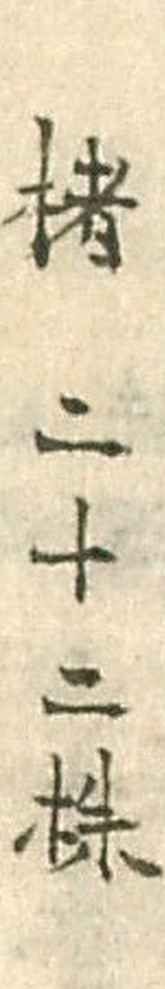楮二十二株
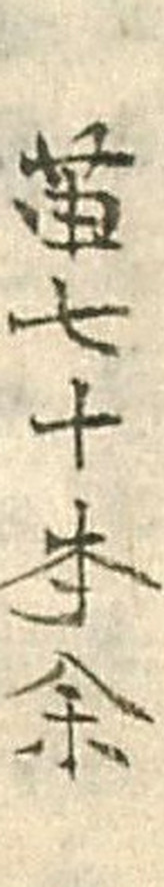苗七十本余
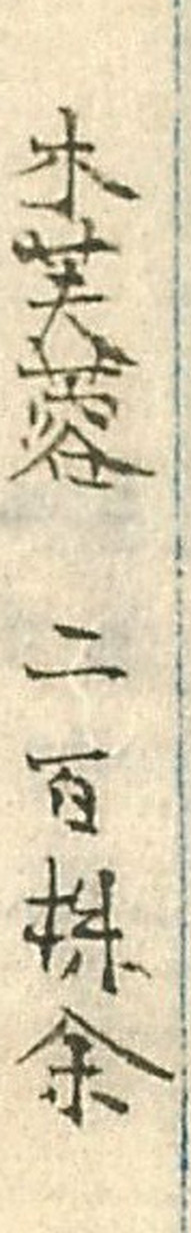木芙蓉二百株余
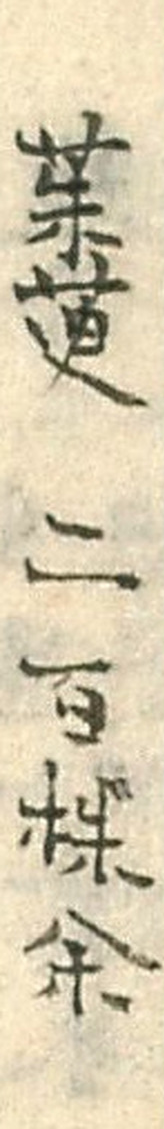茱萸二百株余
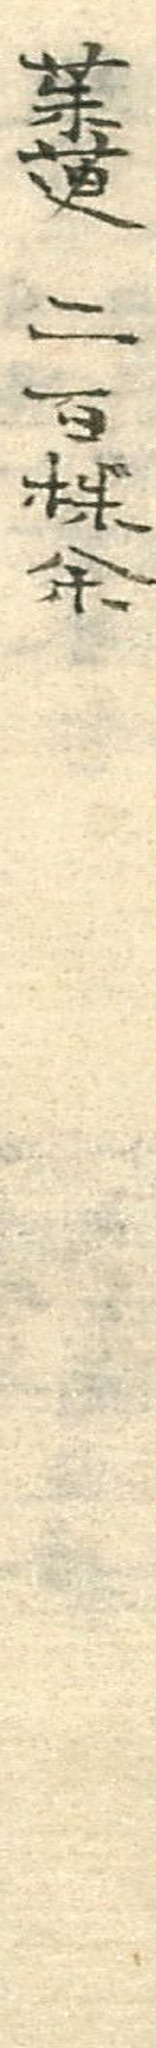茱萸二百株余
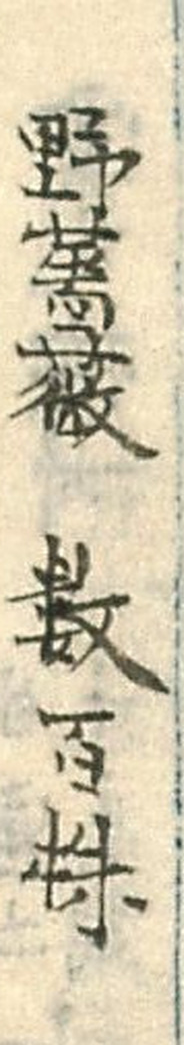野薔薇数百株
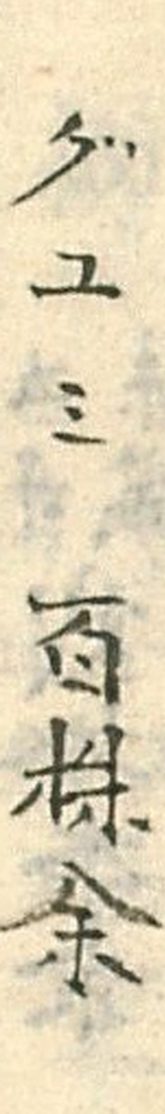グユミ百株余
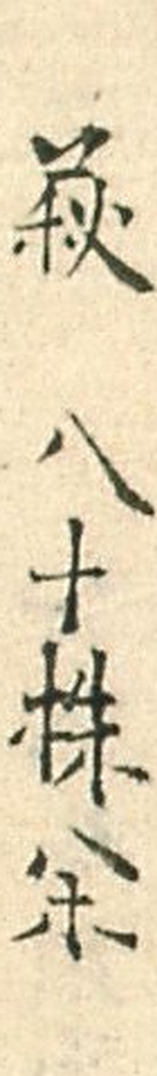萩八十株余
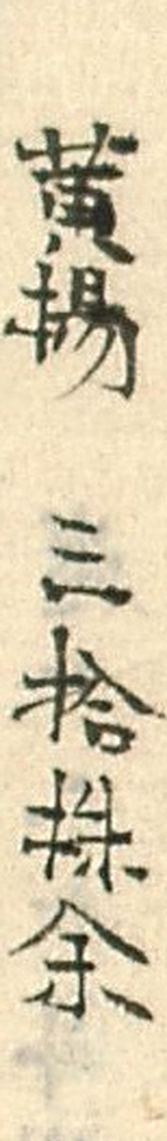黄楊三拾株余
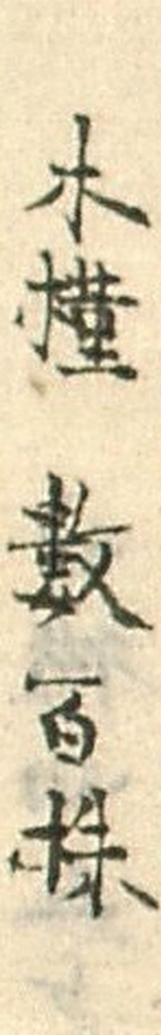木槿数百株
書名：山林共進会取調書
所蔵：鳴門教育大学 Naruto University of Education
